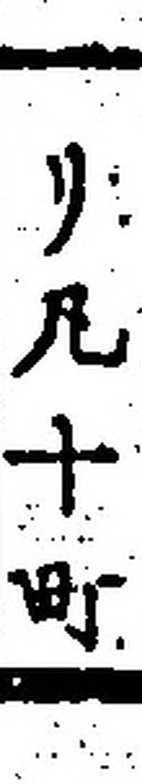リ凡十町
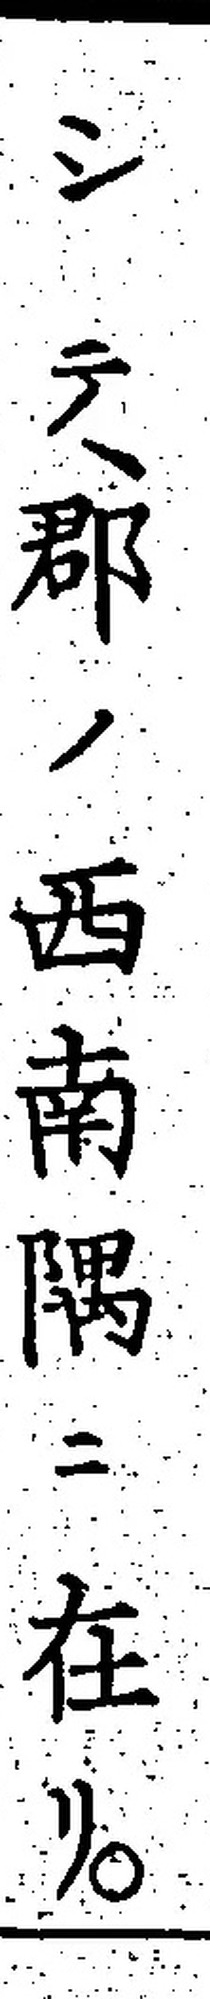シテ、郡ノ西南隅ニ在リ。
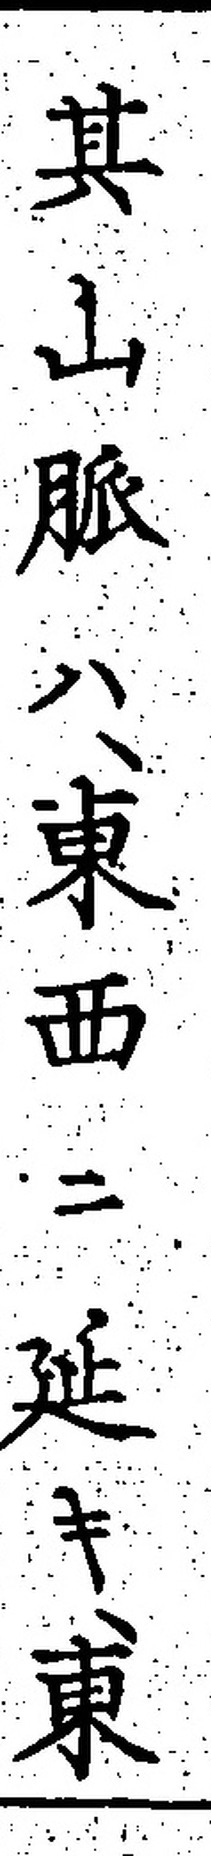其山脈ハ、東西ニ延キ、東
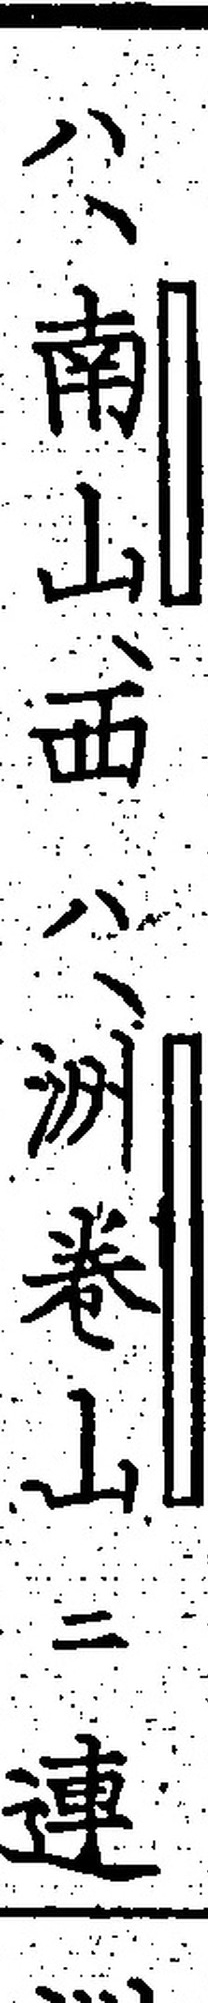ハ、南山、西ハ、洲巻山ニ連
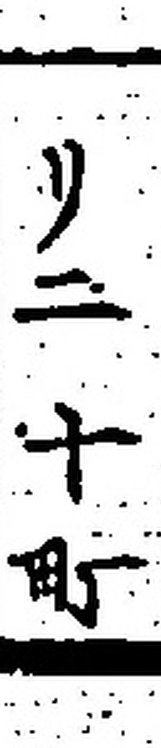リ二十町
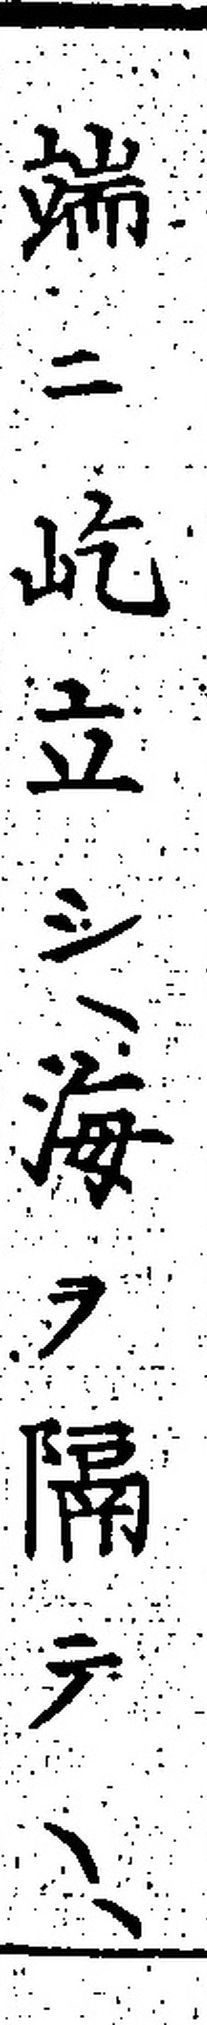端ニ屹立シ、海ヲ隔テヽ、
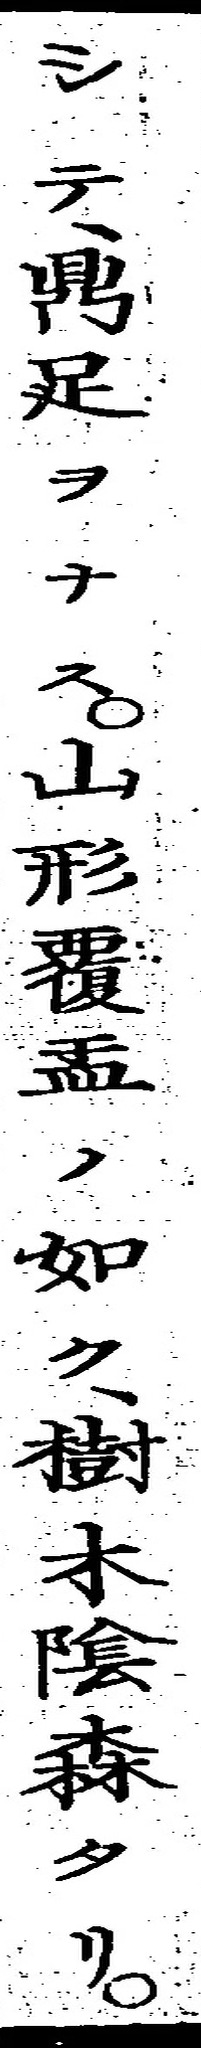シテ、鼎足ヲナス。山形覆盂ノ如ク、樹木陰森タリ。
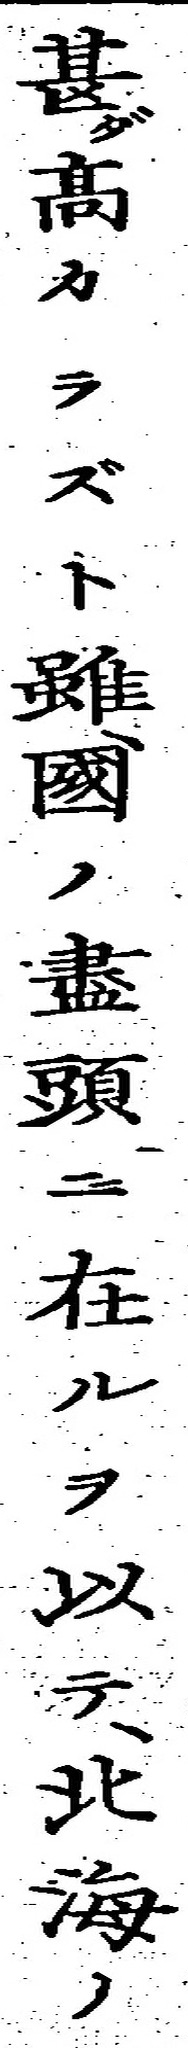甚高カラズト雖、国ノ尽頭ニ在ルヲ以テ、北海ノ
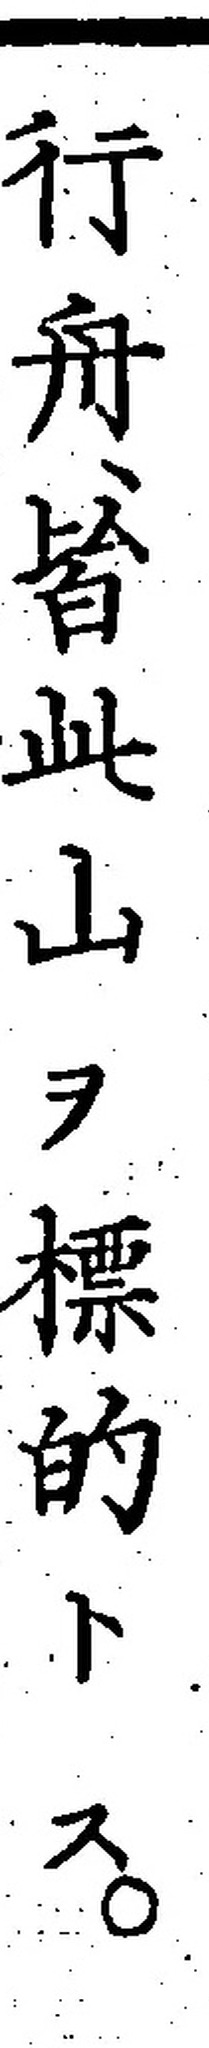行舟、皆此山ヲ標的トス。
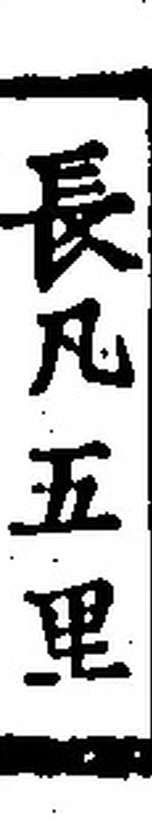長凡五里
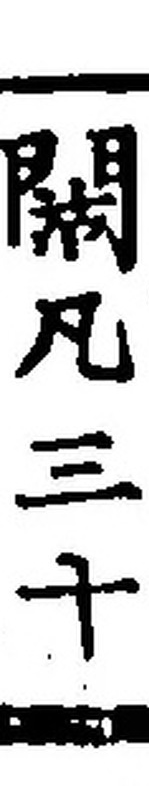闊凡三十
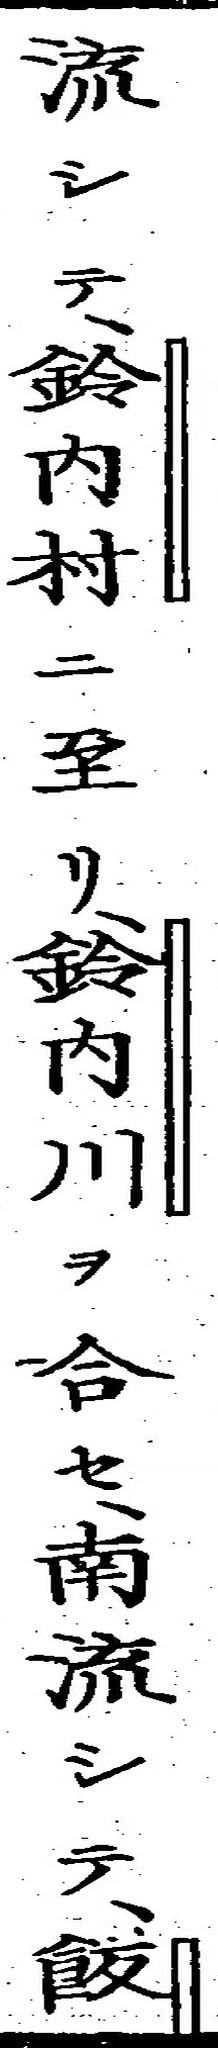流シテ、鈴内村ニ至リ、鈴内川ヲ合セ、南流シテ、飯
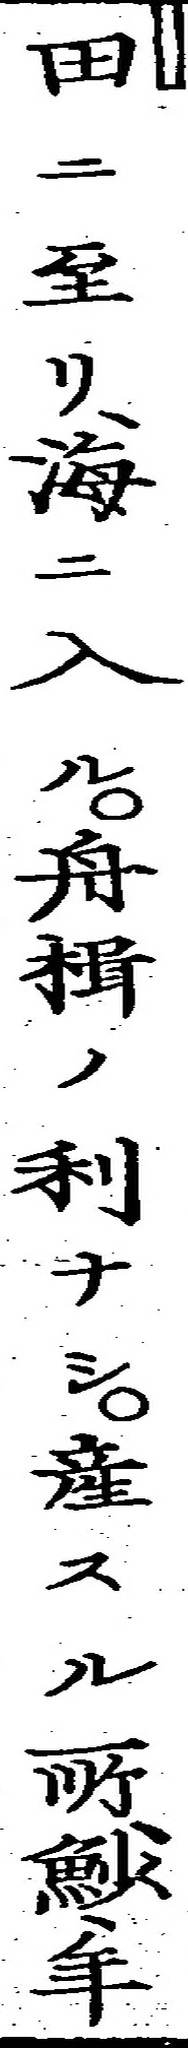田ニ至リ、海ニ入ル。舟楫ノ利ナシ。産スル所、魦・年
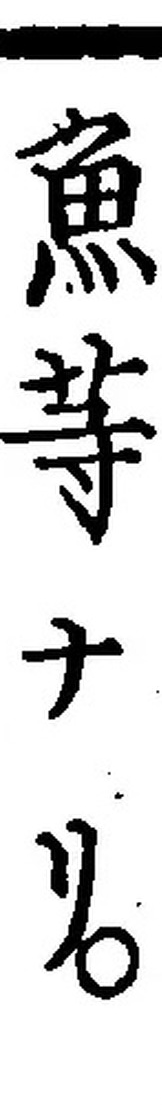魚等ナリ。
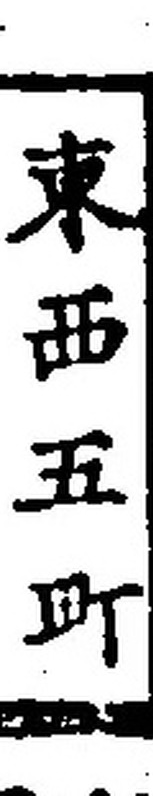東西五町
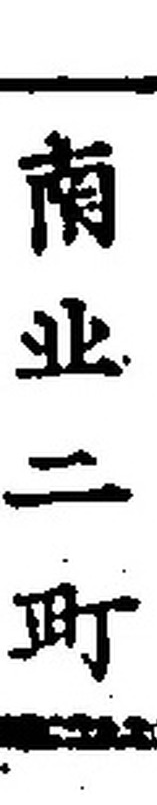南北二町
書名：能登地誌略
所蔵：国立国会図書館 National Diet Library, JAPAN
